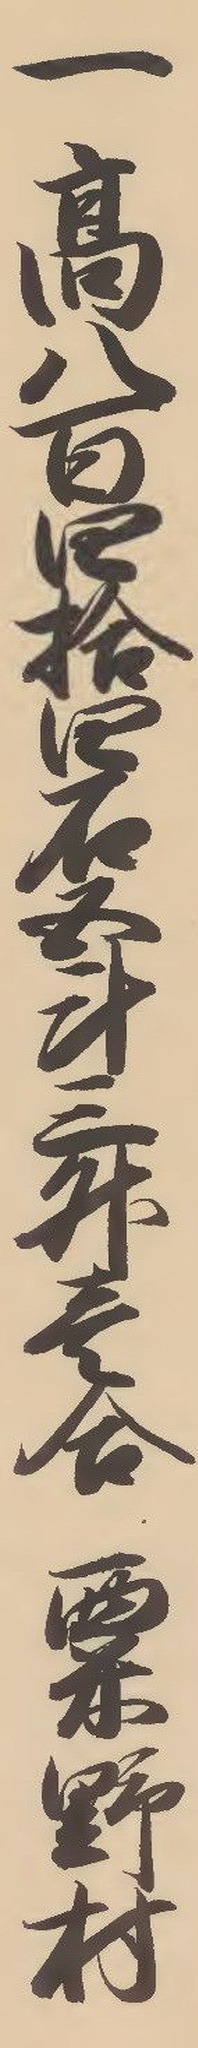一高八百四拾四石五斗三升壱合粟野村
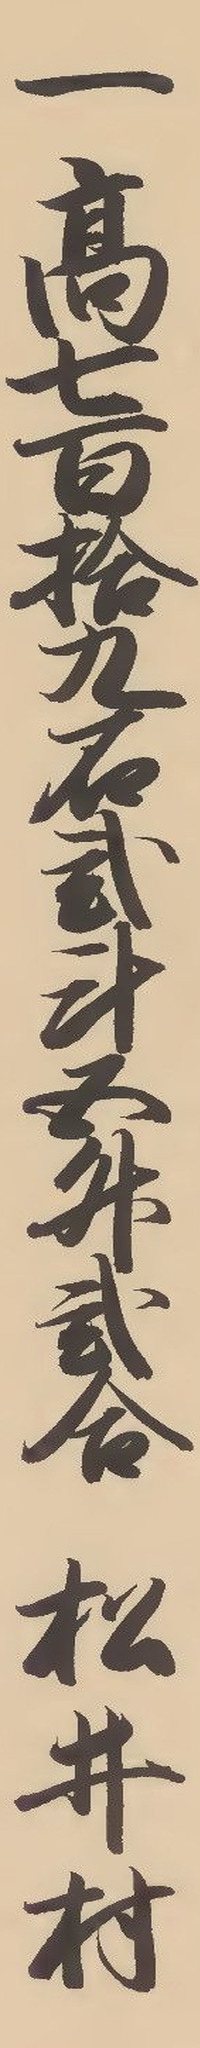一高七百拾九石弐斗五升弐合松井村
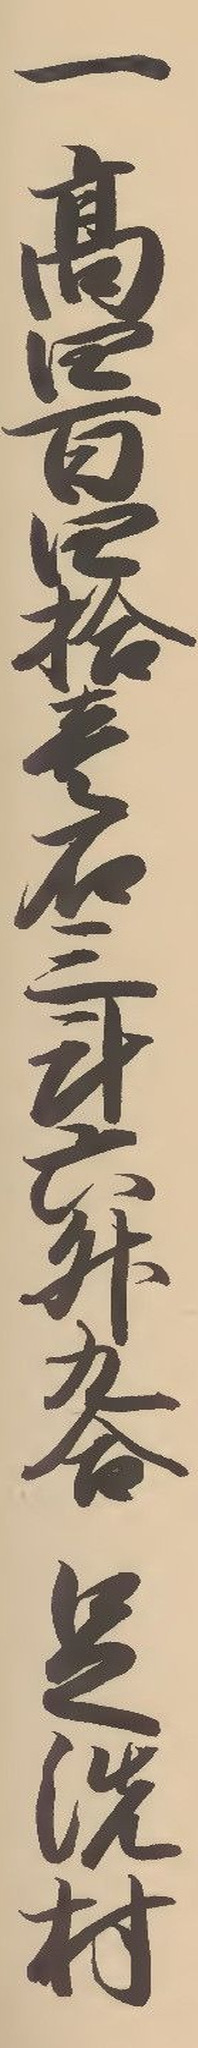一高四百四拾壱石三斗六升九合足洗村
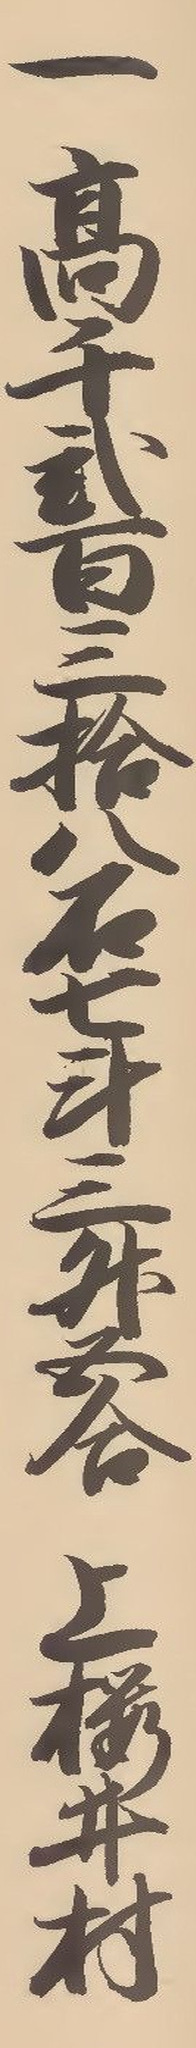一高千弐百三拾八石七斗三升五合上桜井村
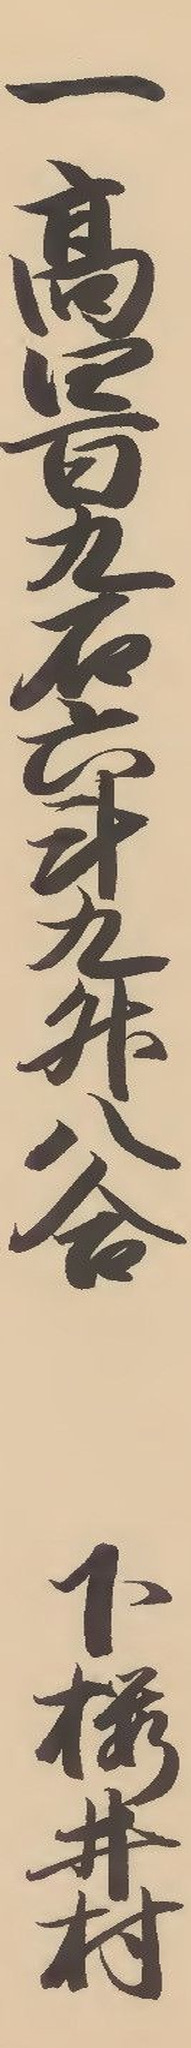一高四百九石六斗九升八合下桜井村
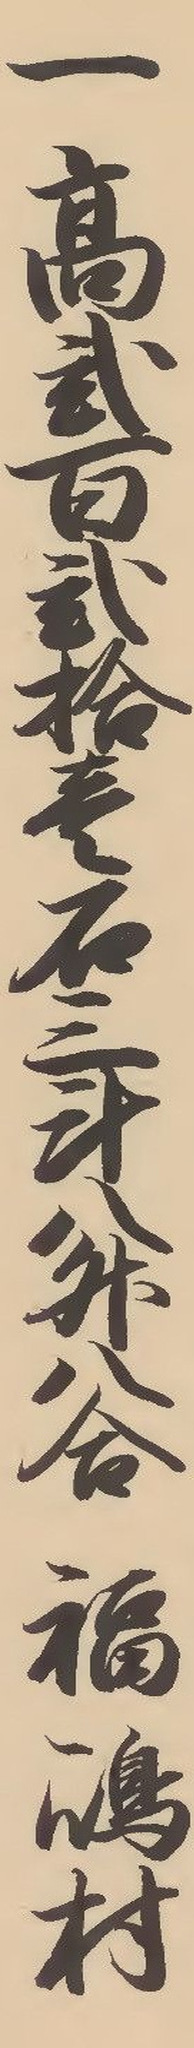一高弐百弐拾壱石三斗八升八合福島村
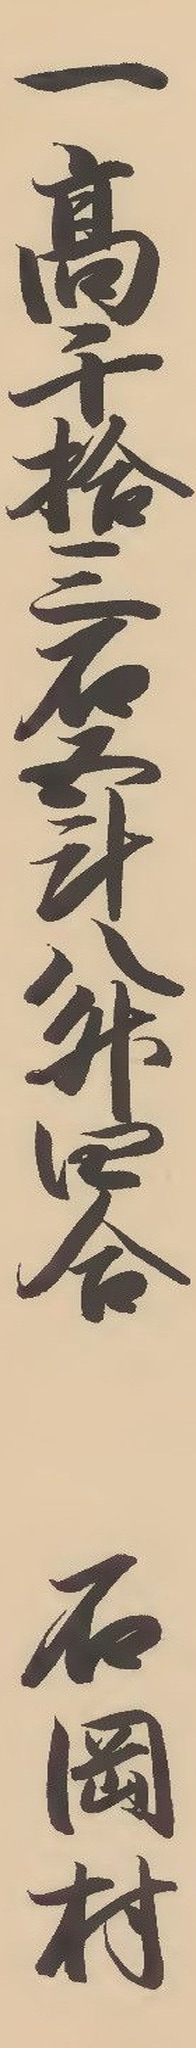一高千拾三石五斗八升四合石岡村

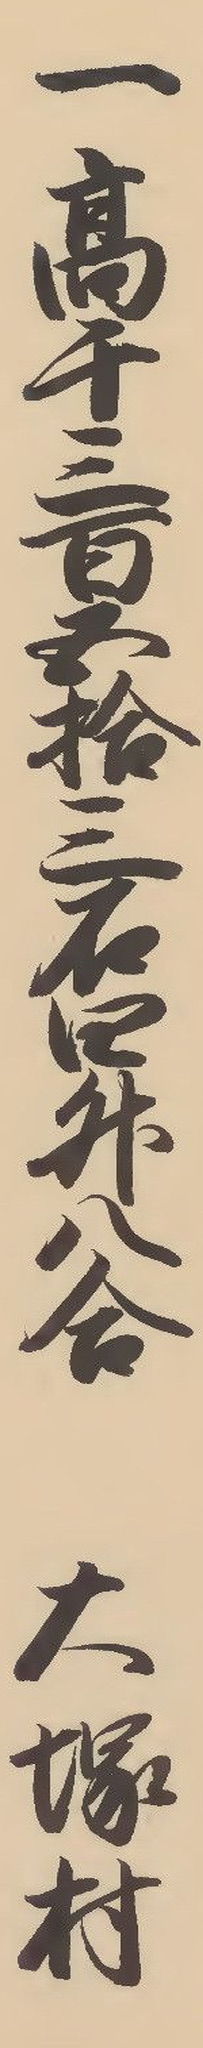一高千三百五拾三石四升八合大塚村
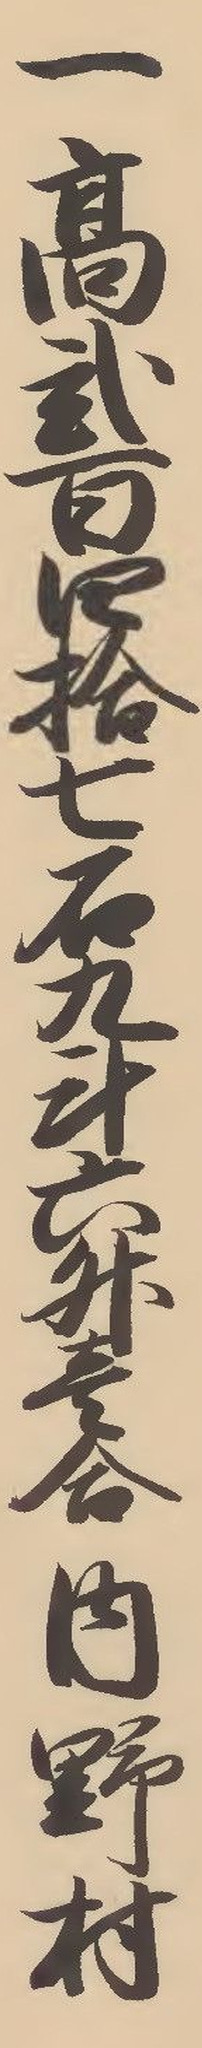一高弐百四拾七石九斗六升壱合内野村
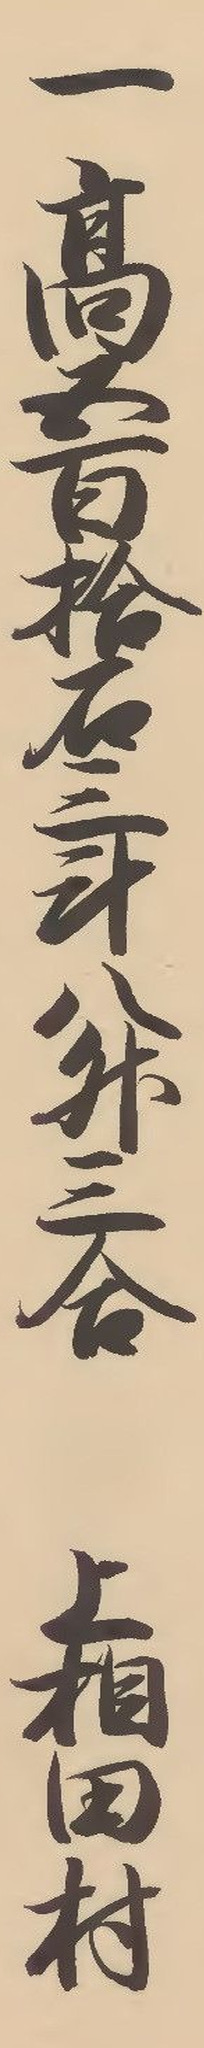一高五百拾石三斗八升三合上相田村
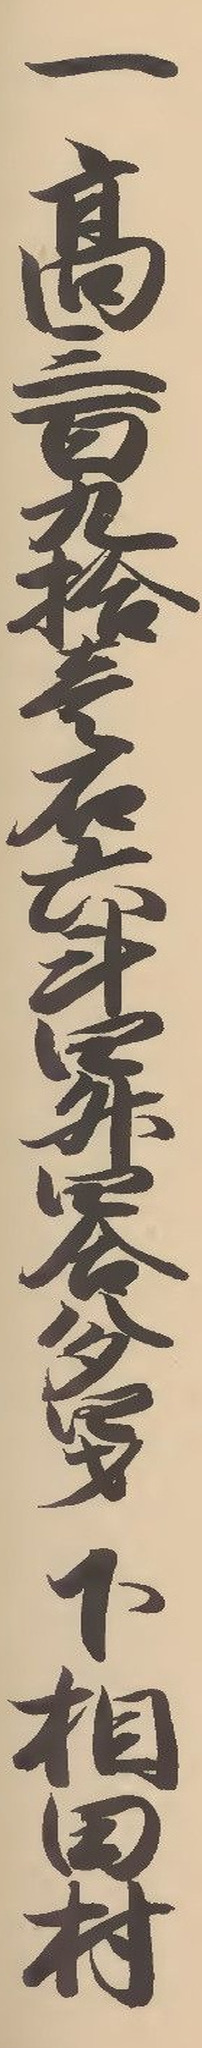一高三百九拾壱石六斗四升四合八勺４才下相田村
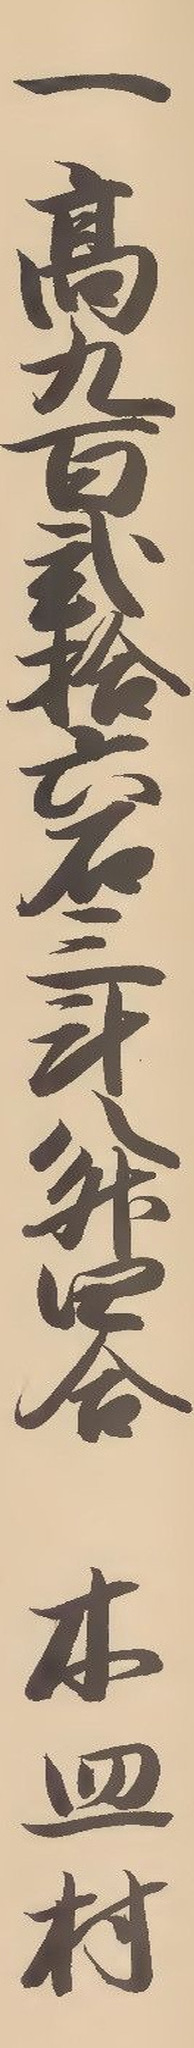一高九百弐拾六石三斗八升四合木皿村
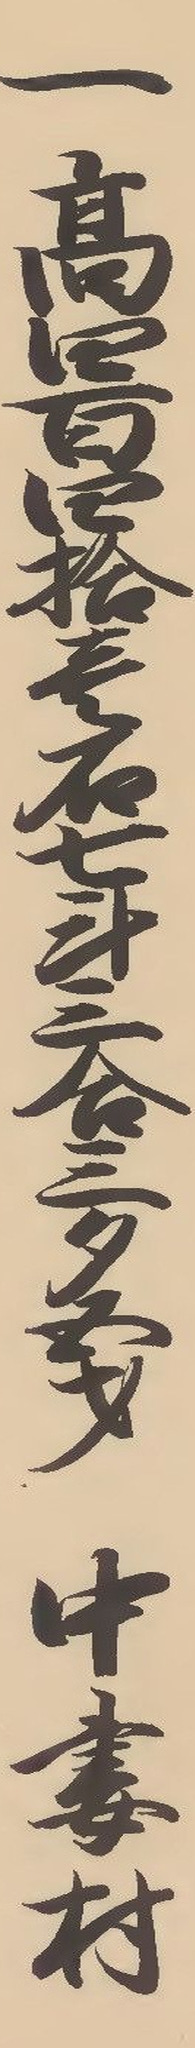一高四百四拾壱石七斗三合三勺五才中妻村
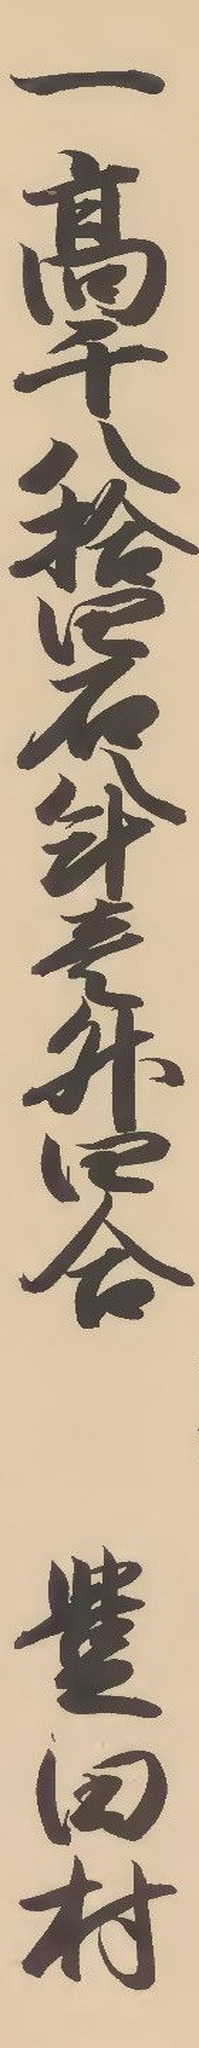一高千八拾四石八斗壱升四合豊田村
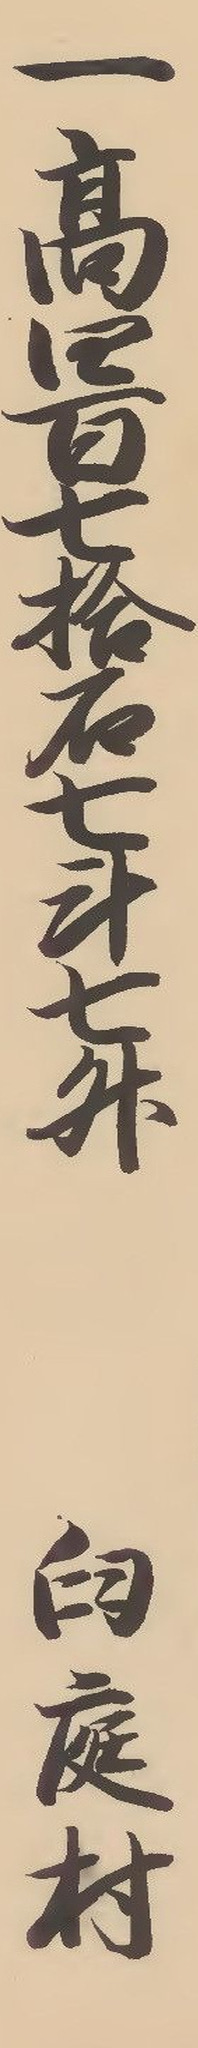一高四百七拾石七斗七升臼庭村

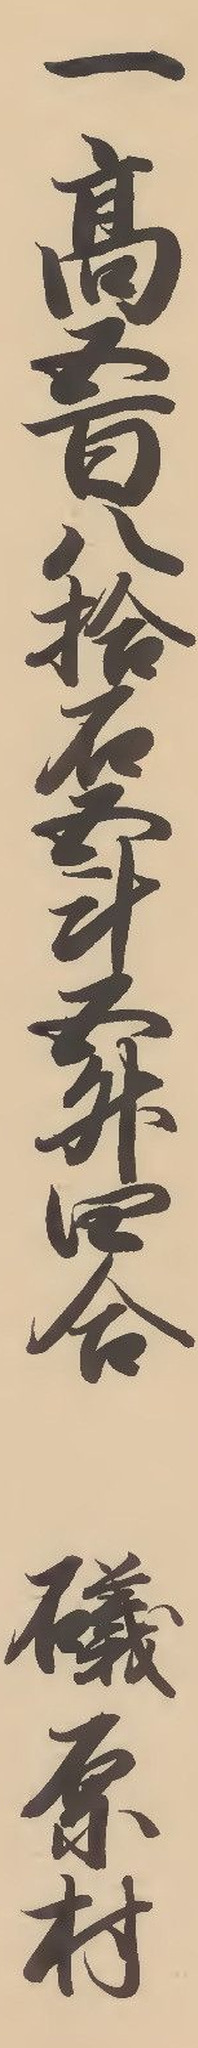一高五百八拾石五斗五升四合磯原村
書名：常陸国郷帳
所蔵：国立公文書館 National Archives of Japan
